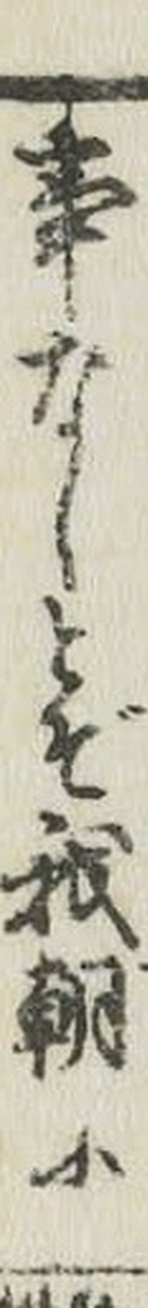事なしとぞ我朝に
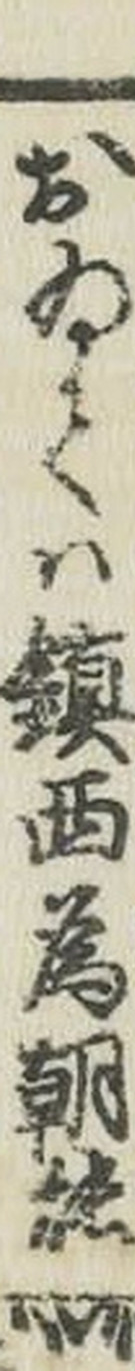おゐては鎮西為朝能
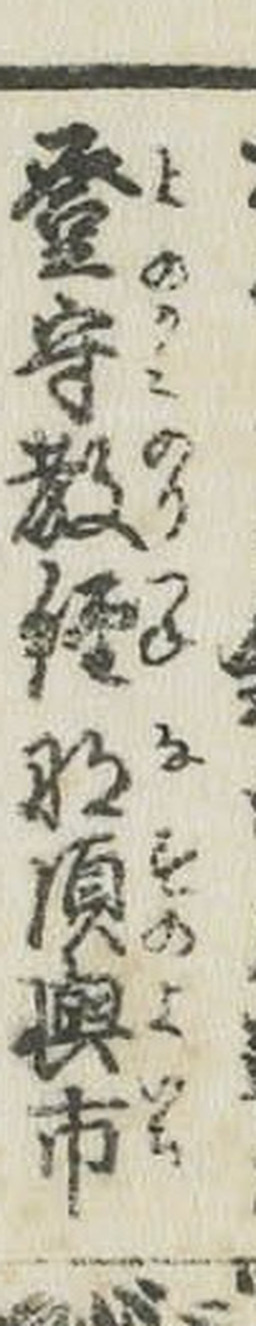登守教経那須与市
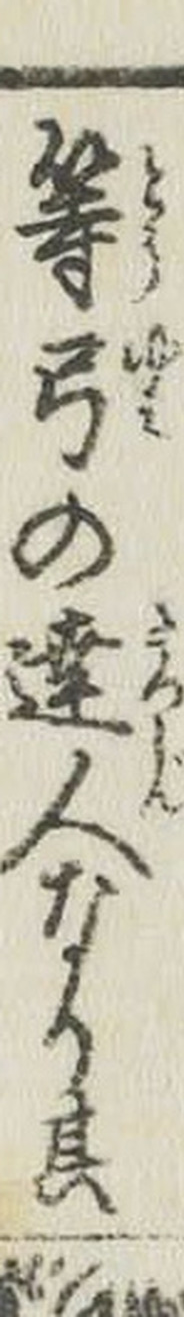等弓の達人なり其
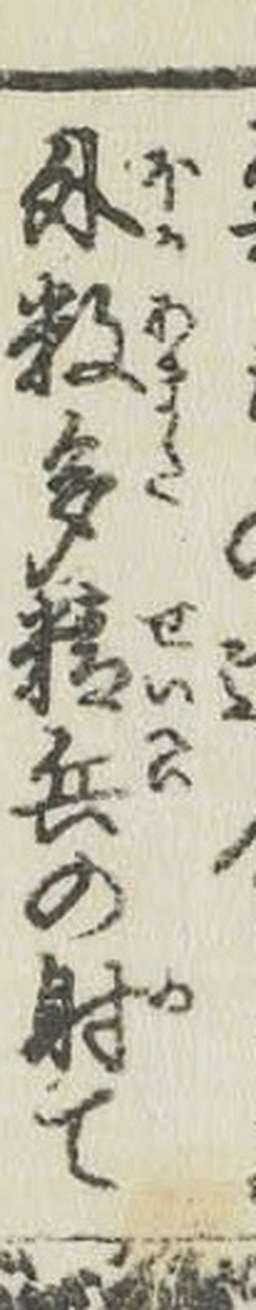外数多精兵の射て
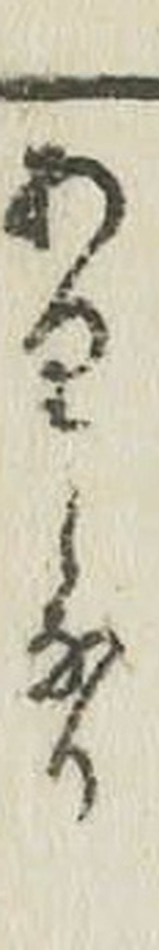ありしなり
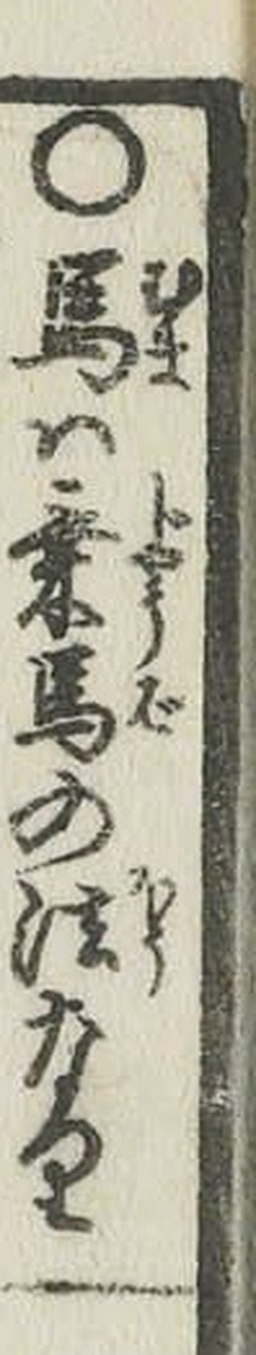○馬は乗馬の法なり
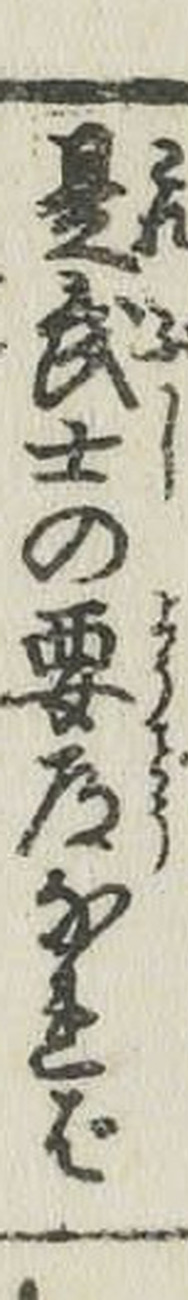是武士の要道なれば
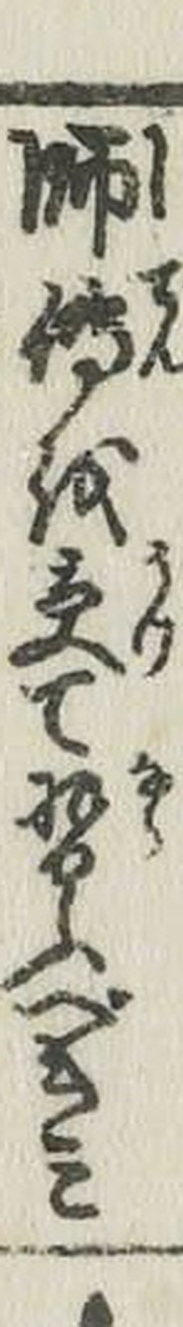師伝を受て習ふべきこ
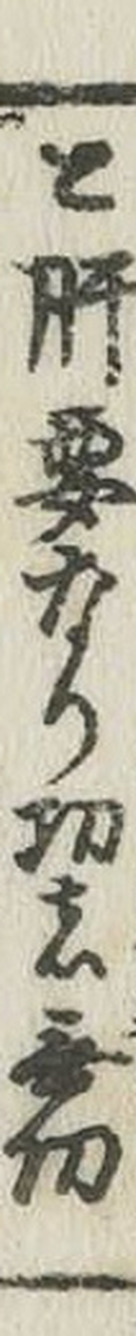と肝要なり巧者無功
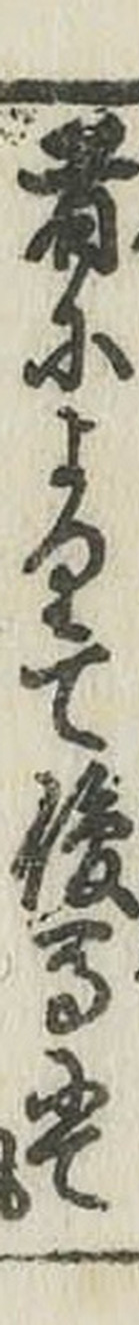者によりて駿馬にても
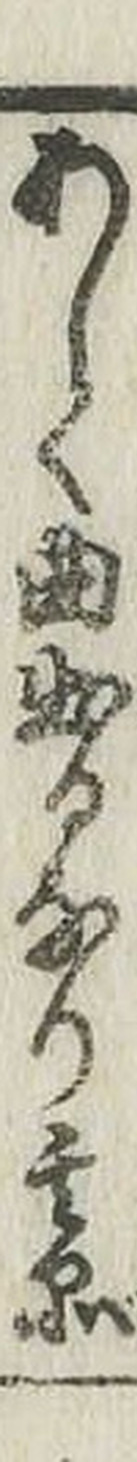あしく曲出るなり其品
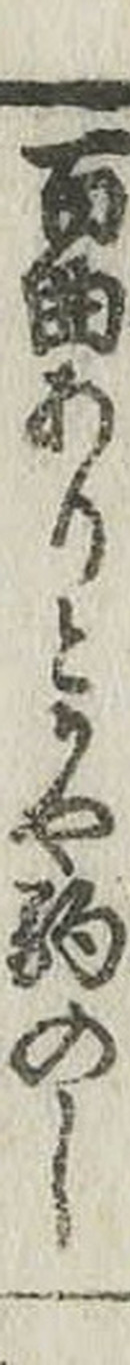百曲ありとかや駒のし
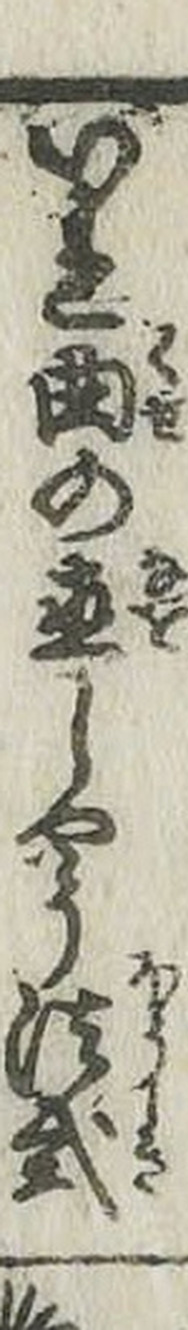いれ曲の直しやう法式
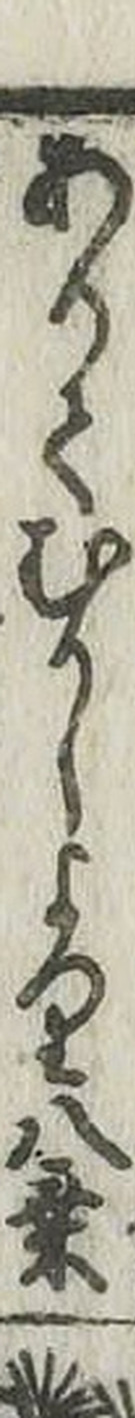ありてむかしより八乗
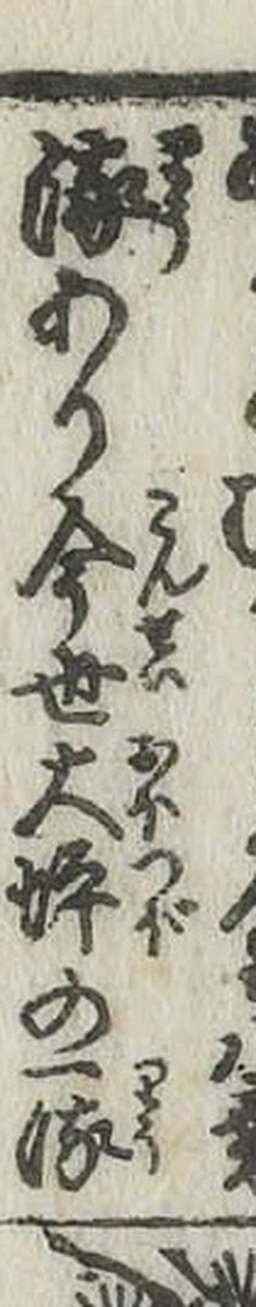流あり今世大坪の一流
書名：増補頭書訓蒙図彙大成 10巻 10:巻之21
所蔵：東京学芸大学教育コンテンツアーカイブ
